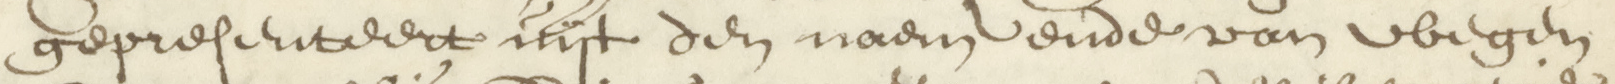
gepresenteert uijt den naem ende van wegen
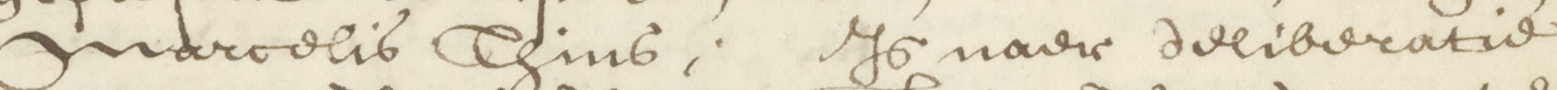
Marcelis Thins; Is naer deliberatie
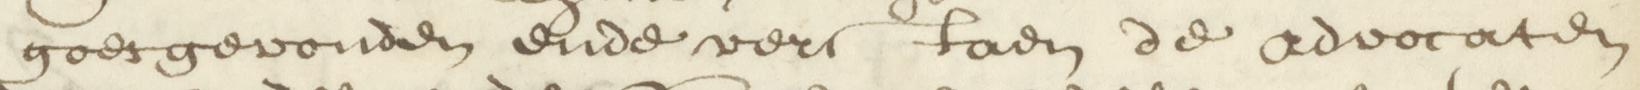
goetgevonden ende verstaen de advocaten
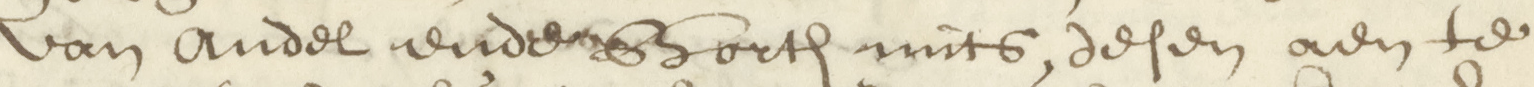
van Andel ende Borth mits desen aen te
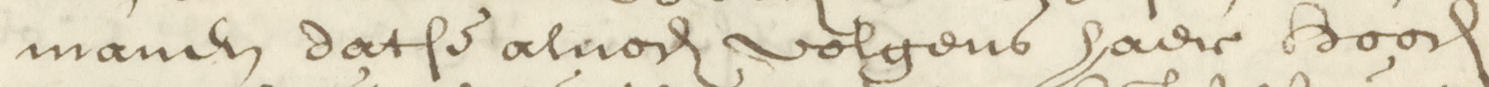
manen datse alnoch volgens haer Hooch
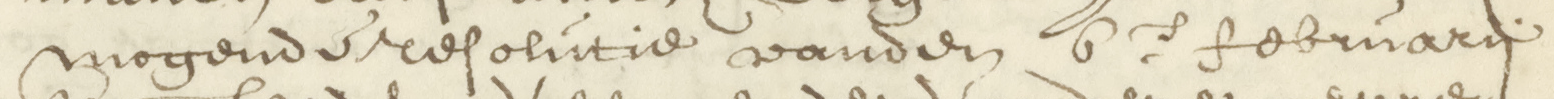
Mogende resolutie vanden 6e februarij
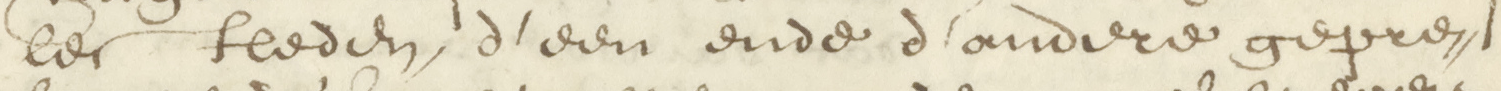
lestleden, d‛een ende d'andere gepre„
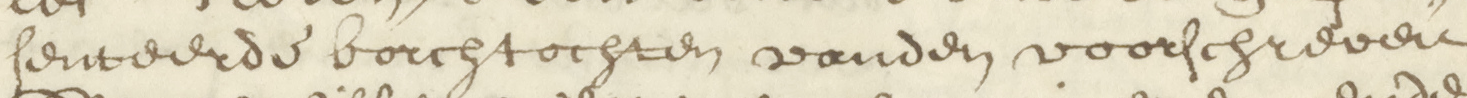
senteerde borchtochten vanden voorschreven
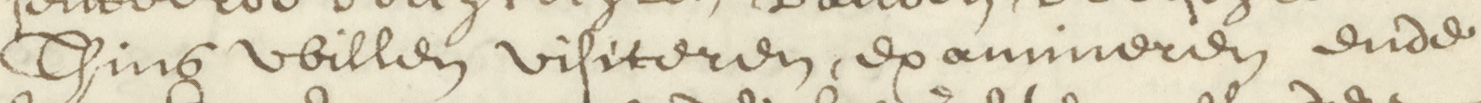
Thins willen visiteren, examineren ende
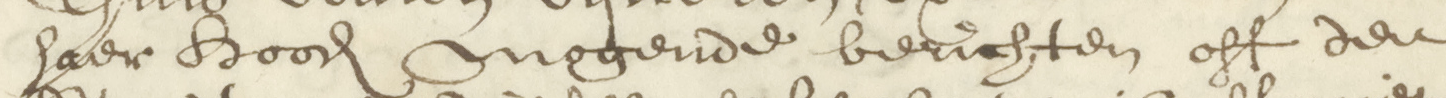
haer Hooch Mogende berichten off den
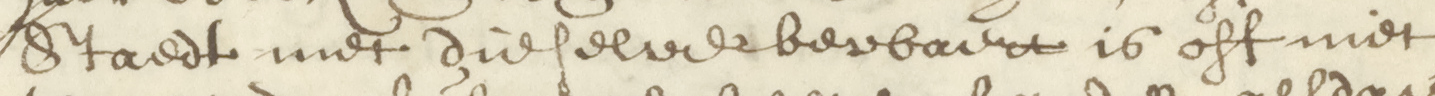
Staedt met dieselve bewaert is off niet,
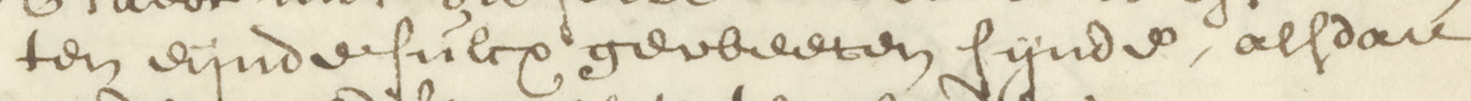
ten eijnde sulcx geweeten sijnde, alsdan
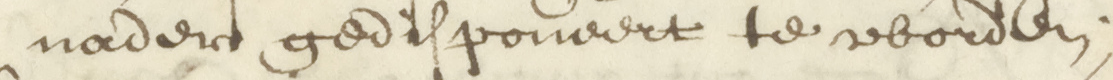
nader gedisponeert te worden.
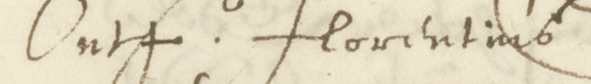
Ontfr. Florentius
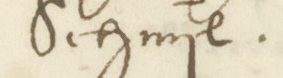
Schuijl.
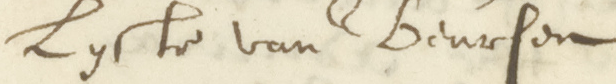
Lyste van Beursen
